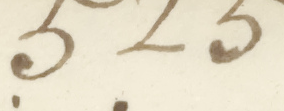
525
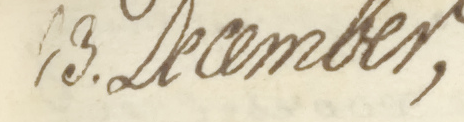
13. December,
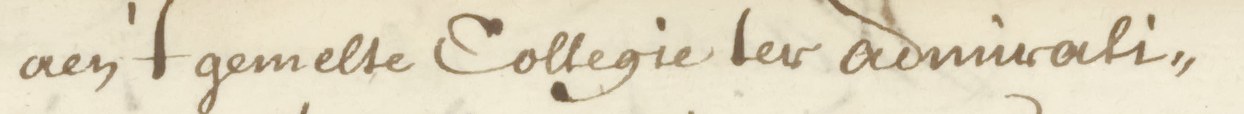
aen ‛t gemelte Collegie ter admirali„
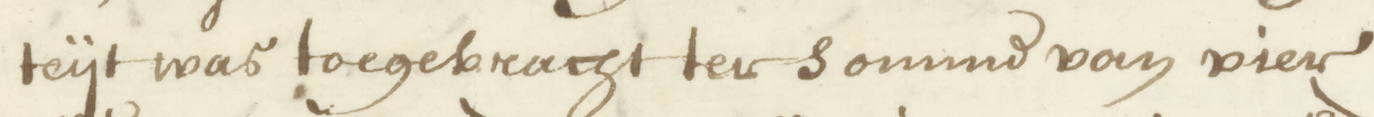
teijt was toegebracht ter somme van vier
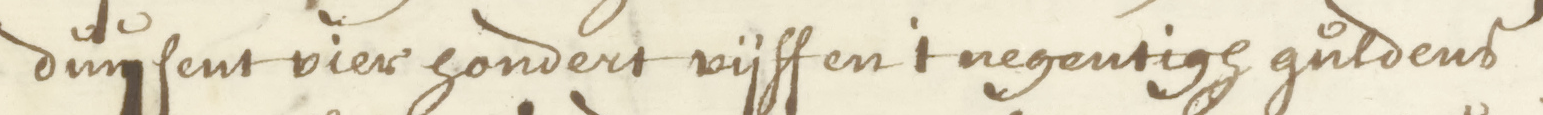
duijsent vier hondert vijff en ‛t negentigh guldens
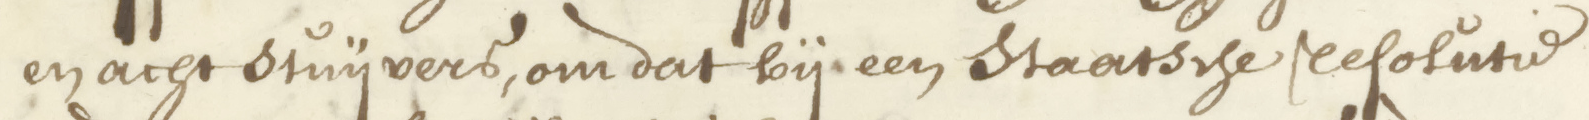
en acht stuijvers, om dat bij een Staatsche resolutie
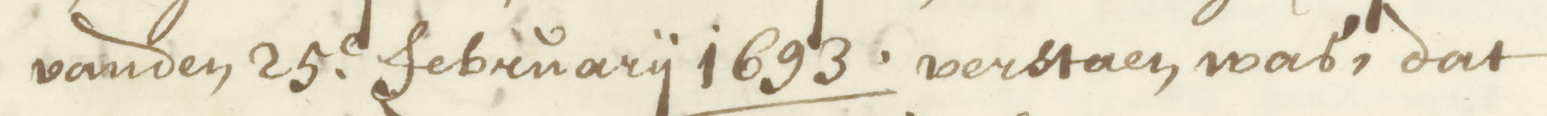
vanden 25e. februarij 1693. verstaen, was, dat
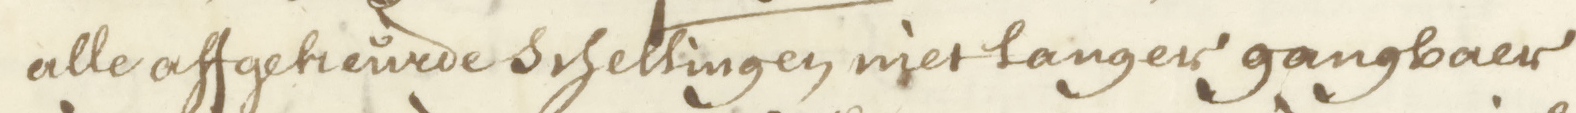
alle affgekeurde schellingen niet langer gangbaer
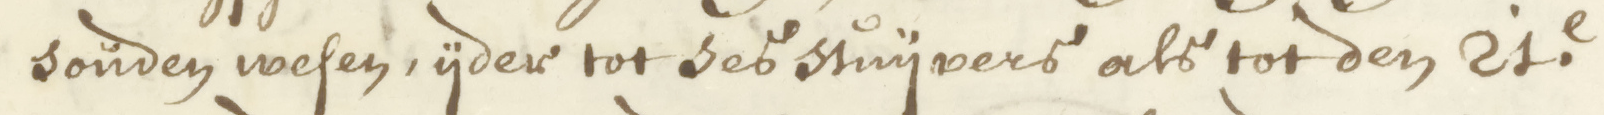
souden wesen, ijder tot ses stuijvers als tot den 21e.
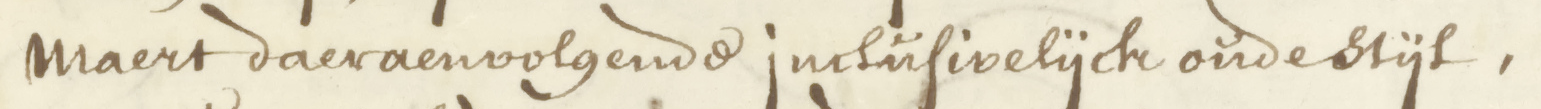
Maert daeraenvolgende inclusivelijck oude stijl,
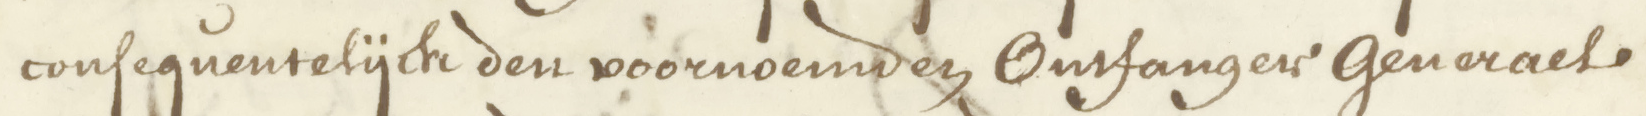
consequentelijck den voornoemden Ontfanger Generael
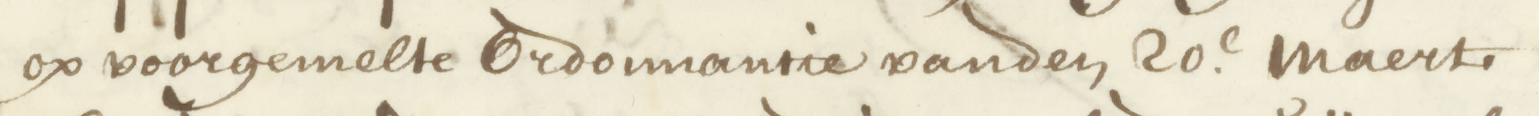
op voorgemelte Ordonnantie vanden 20e. Maert
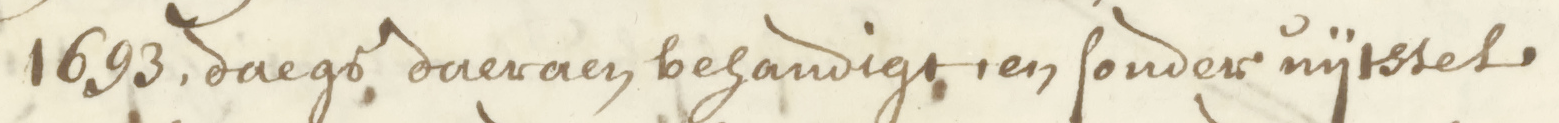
1693, daegs daeraen behandigt, en sonder uijtstel
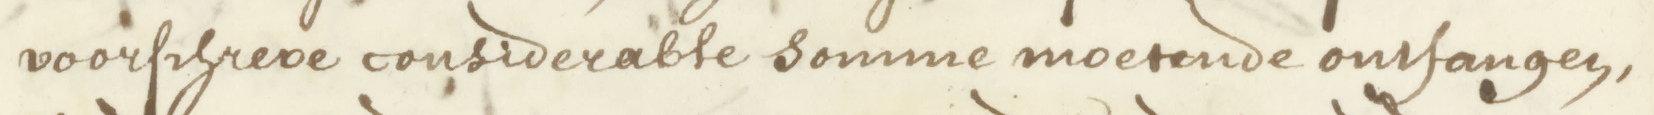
voorschreve considerable somme moetende onfangen,
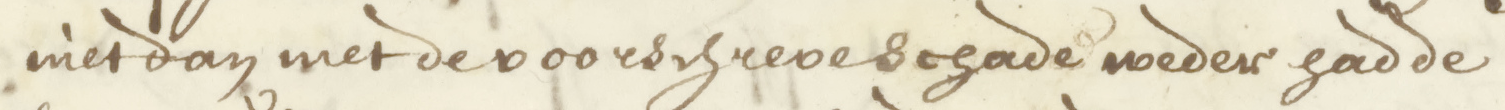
niet dan met de voorschreve schade weder hadde
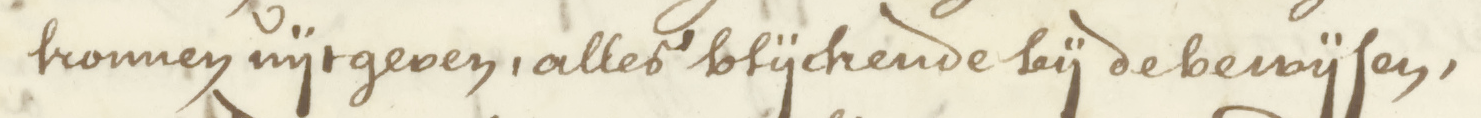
konnen uijtgeven, alles blijckende bij de bewijsen,
